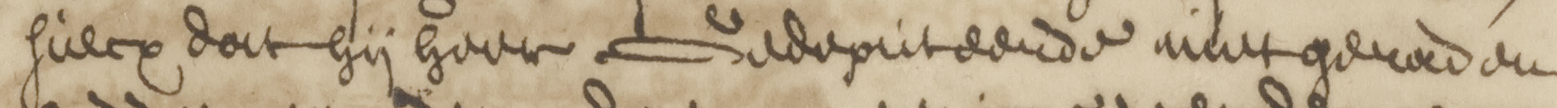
sulcx dat hij heer Gedeputeerde met geraden
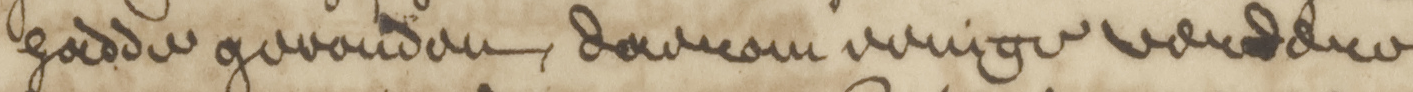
hadde gevonden, daerom eenige verdere
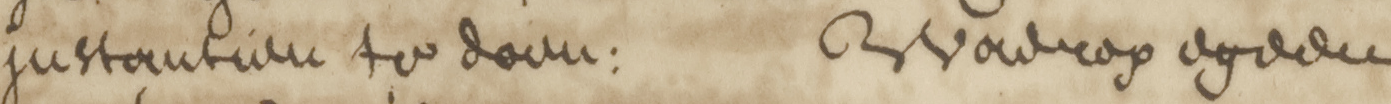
instantien te doen: Waerop egeen
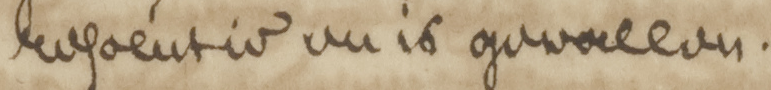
resolutie en is gevallen.
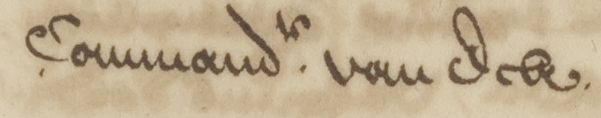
Commandr. van Eck.
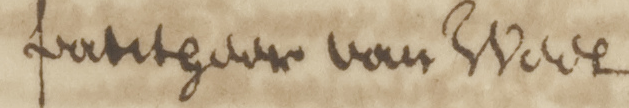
pantheer van Weel
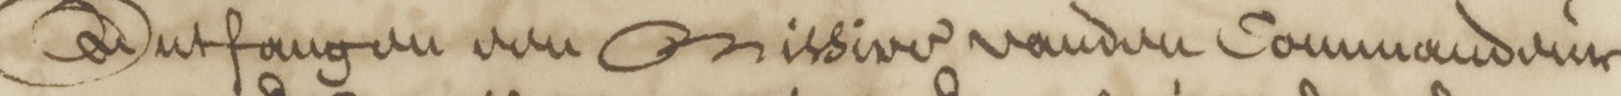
Ontfangen een Missive vanden Commandeur
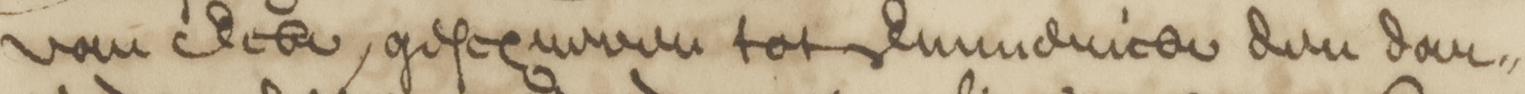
van Eck, geschreven tot Emmerick den dar„
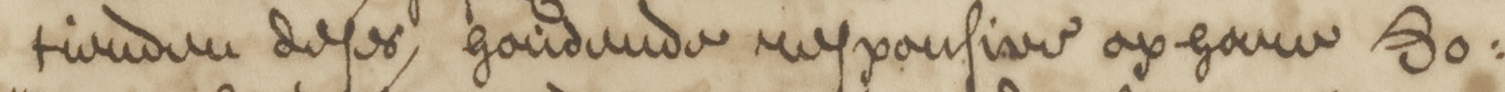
,,tienden deses, houdende responsive op hare Ho:
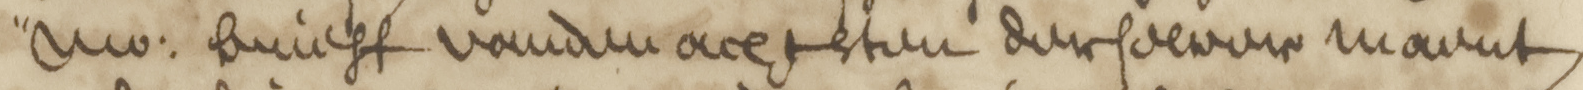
Mo: brieff vanden achtsten derselver maent
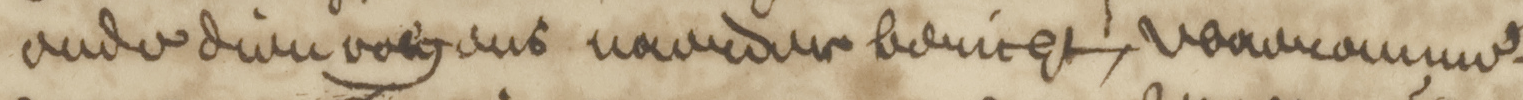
ende dienvolgens naerder bericht; waeromme
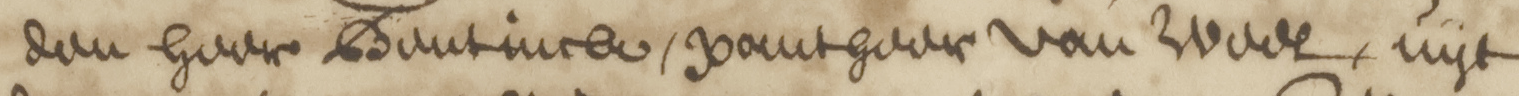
den heer Bentinck, pantheer van Weel, uijt
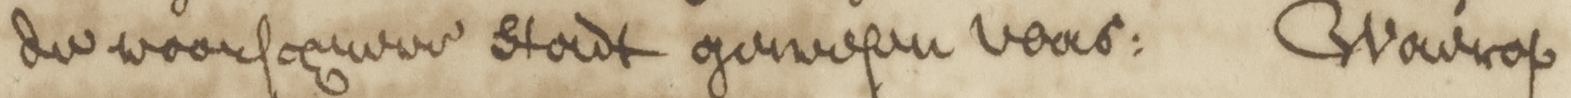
de voorschreve Stadt gewesen was: Waerop
